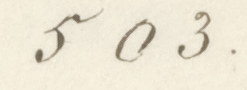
503.
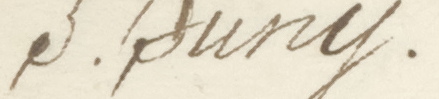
3. Juny.
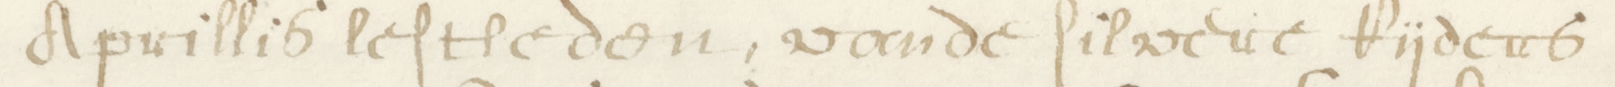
Aprillis lestleden, vande silvere Rijders
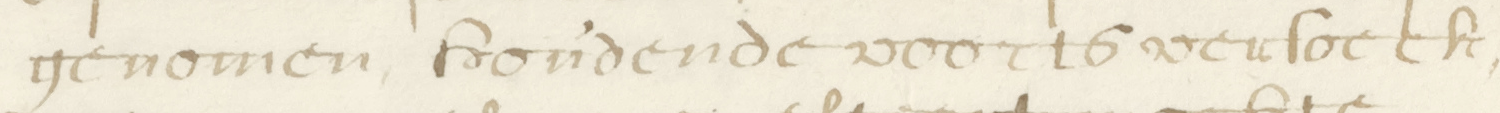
genomen, houdende voorts versoeck,
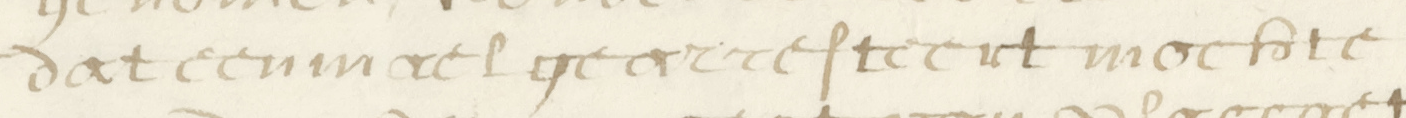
dat eenmael gearresteert mochte
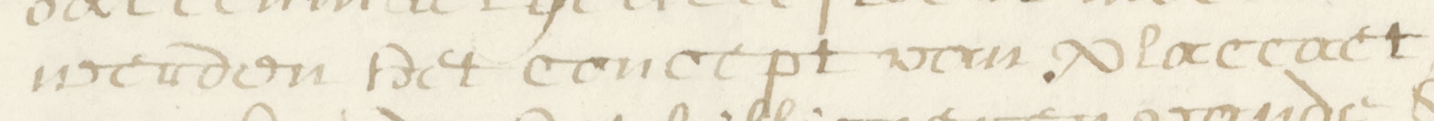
werden het concept van Placcaet,
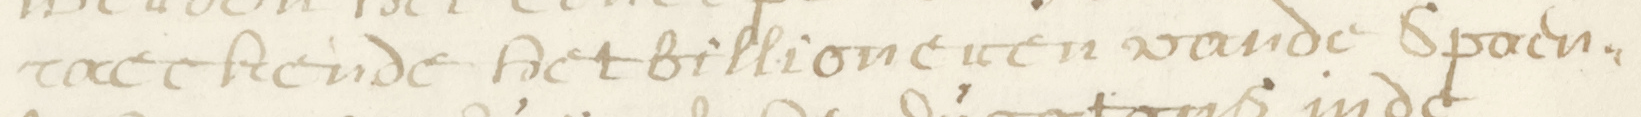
raeckende het billioneren vande Spaen,,
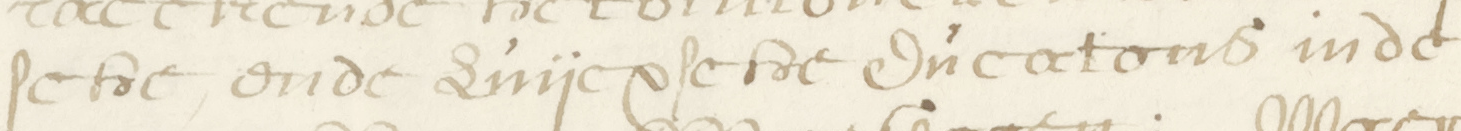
sche, ende Luijcxsche Ducatons inde
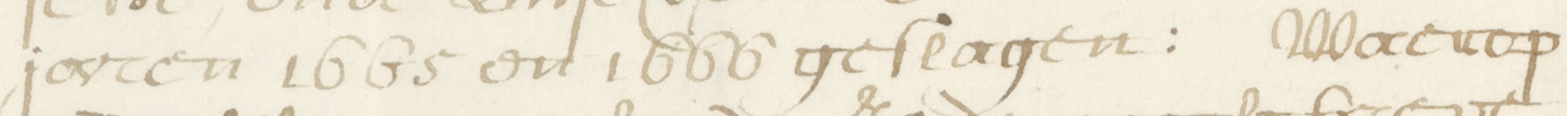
jaren 1665 en 1666 geslagen: Waerop
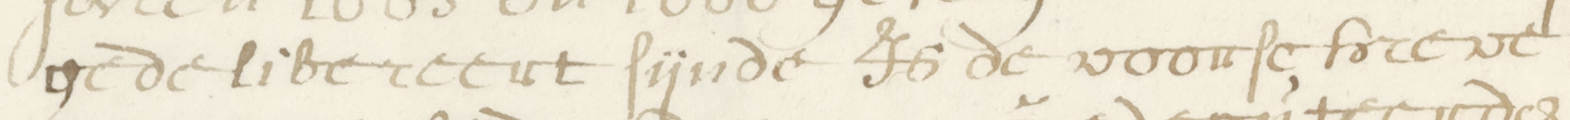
gedelibereert sijnde Is de voorschreve
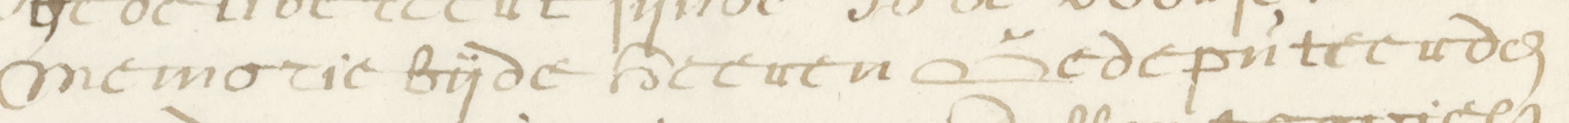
memorie bijde heeren Gedeputeerden
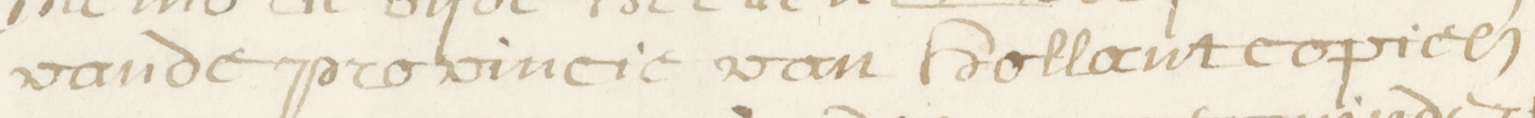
vande provincie van Hollant copiel
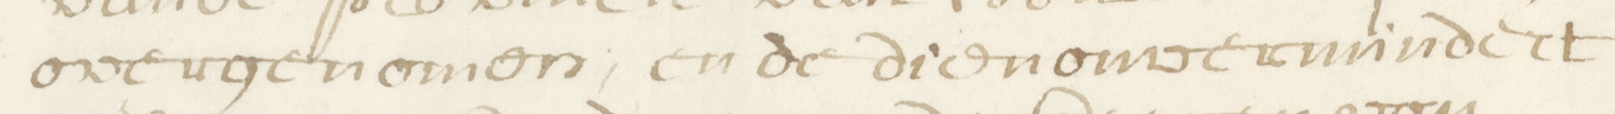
overgenomen, ende dienonvermindert
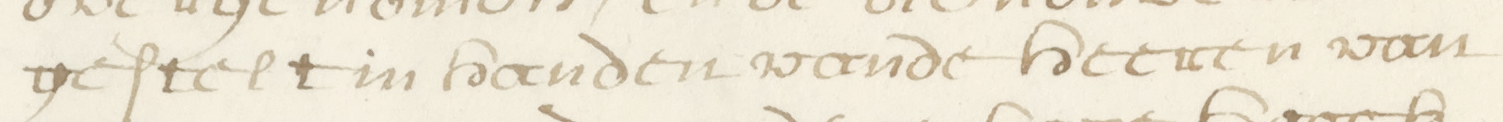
gestelt in handen vande heeren van
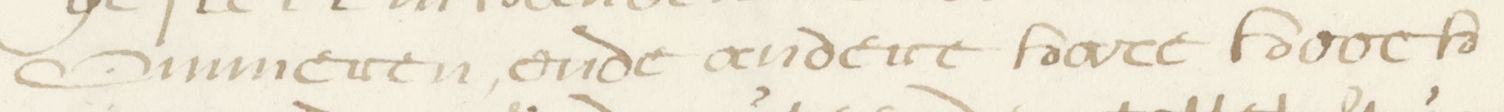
Ommeren, ende andere hare hooch
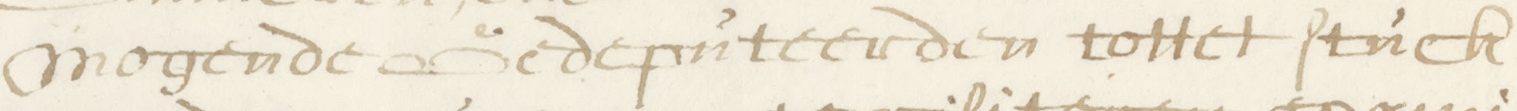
mogende Gedeputeerden tottet stuck
